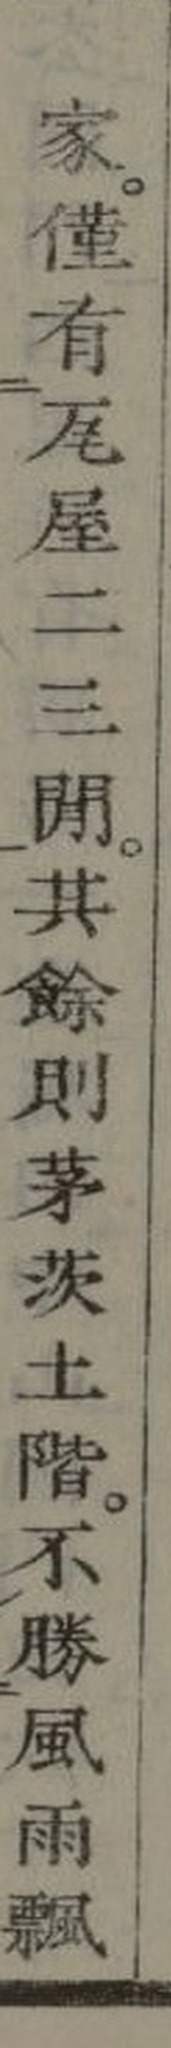家。僅有瓦屋二三閒。其餘則茅茨土階。不勝風雨飄
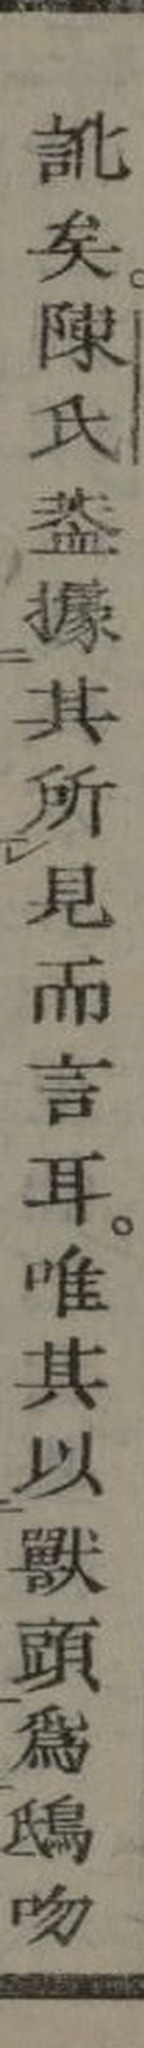訛矣。陳氏葢據其所レ見而言耳。唯其以獸頭爲鴟吻

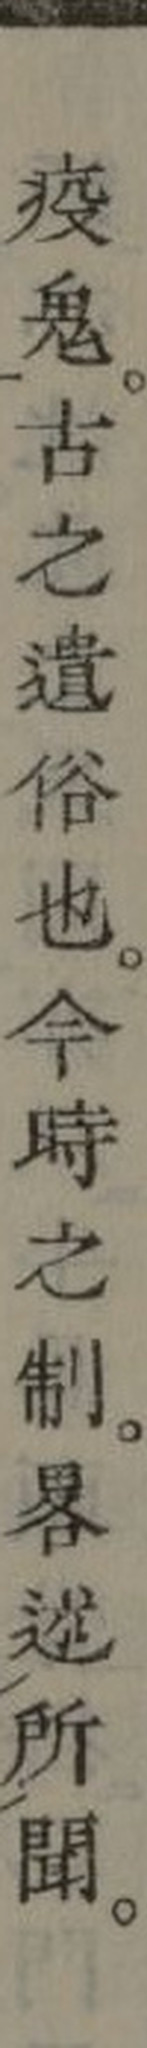疫鬼。古之遺俗也。今時之制。畧述所聞。
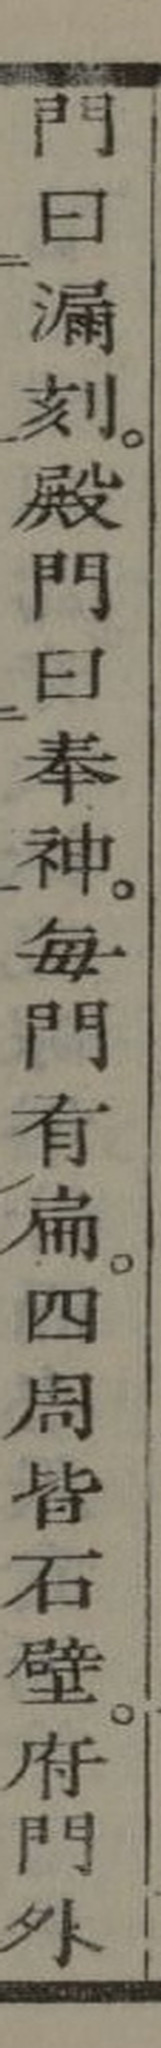門曰漏刻。殿門曰奉神。每門有扁。四周皆石壁。府門外
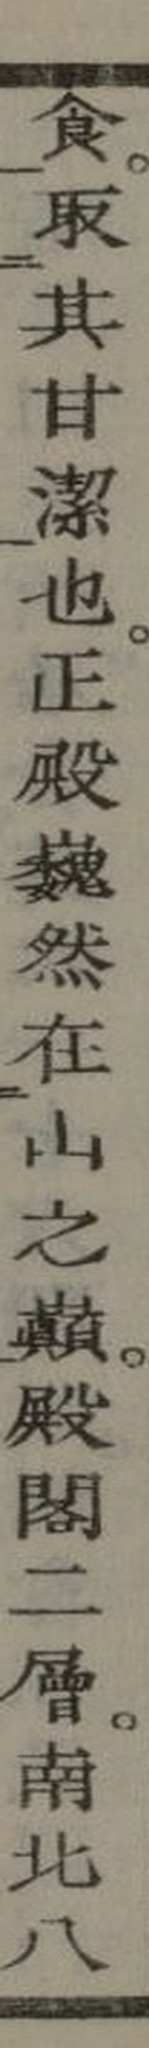食。取其甘潔也。正殿巍然在山之巓。殿閣二層。南北八
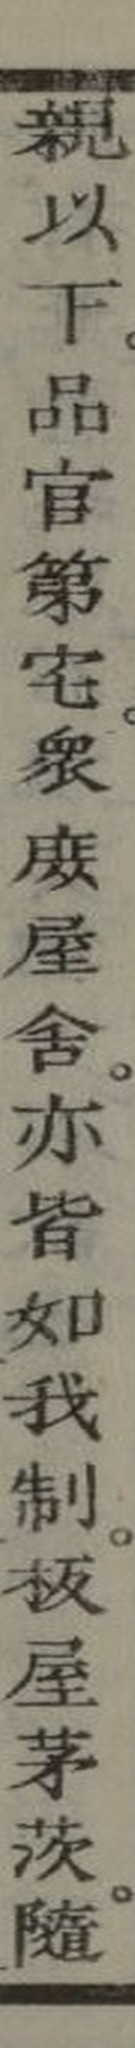親以下。品官第宅。衆庻屋舎。亦皆如我制。板屋茅茨。隨

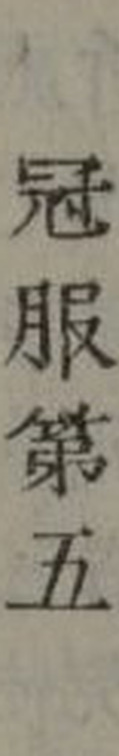冠服第五
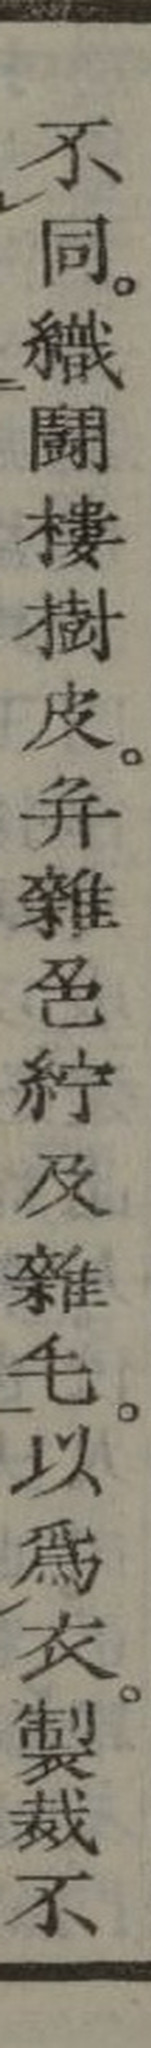不同。織鬪樓樹皮。并雜色紵及雜毛。以爲衣。製裁不
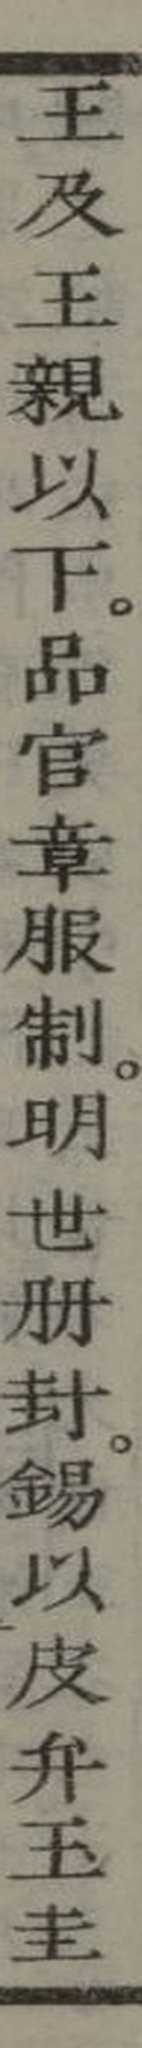王及王親以下。品官章服制。明世册封。錫以皮弁玉圭
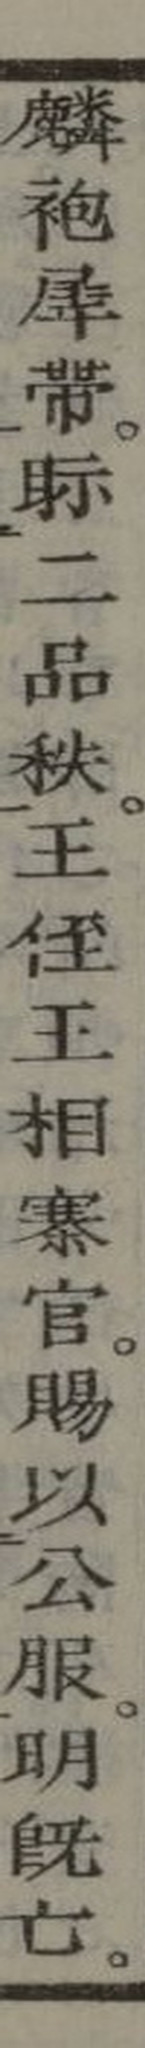麟袍犀帶。眎二品秩。王侄相寨官。賜以公服。明既亡。
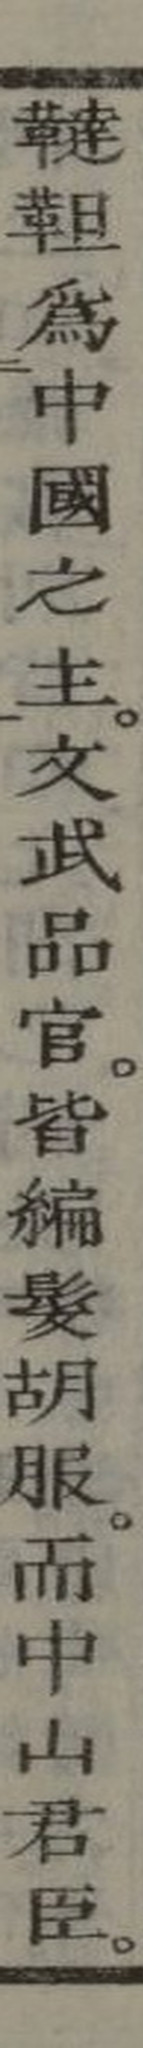韃靼爲中國之主。文武品官。皆編髪胡服。而中山君臣。
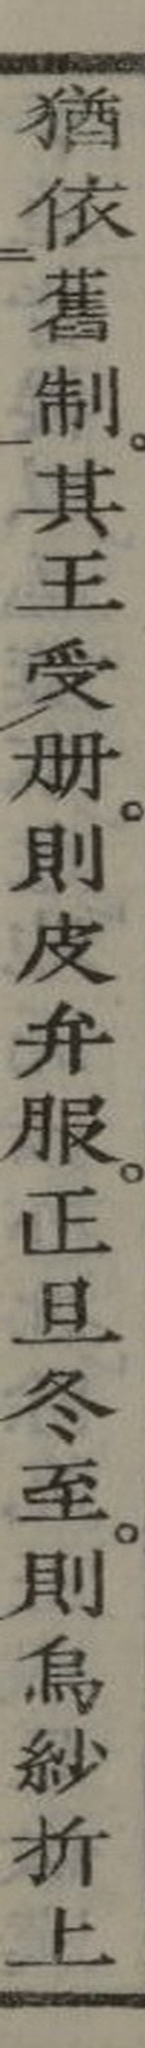猶依舊制。其王受册。則皮弁服。正旦冬至。則烏紗折上
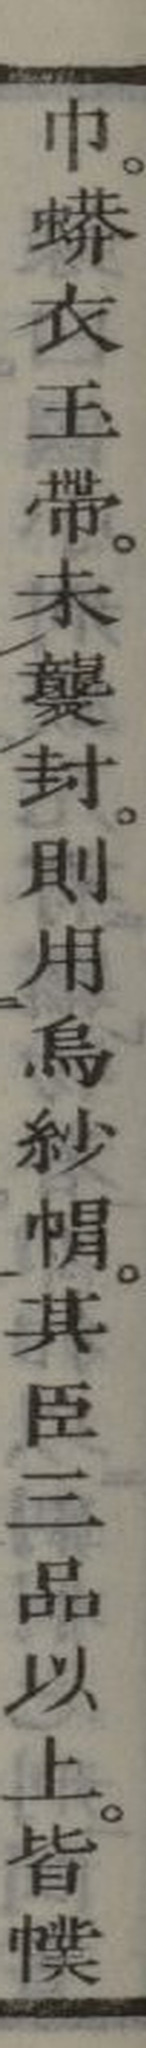巾。蟒衣玉帯。未襲封。則用烏紗帽。其臣三品以上。皆幞
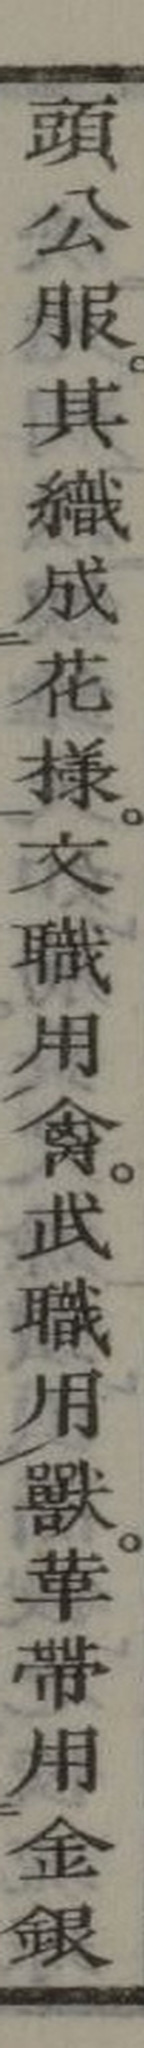頭公服。其織成花様。文職用禽。武職用獸。革帶用金銀
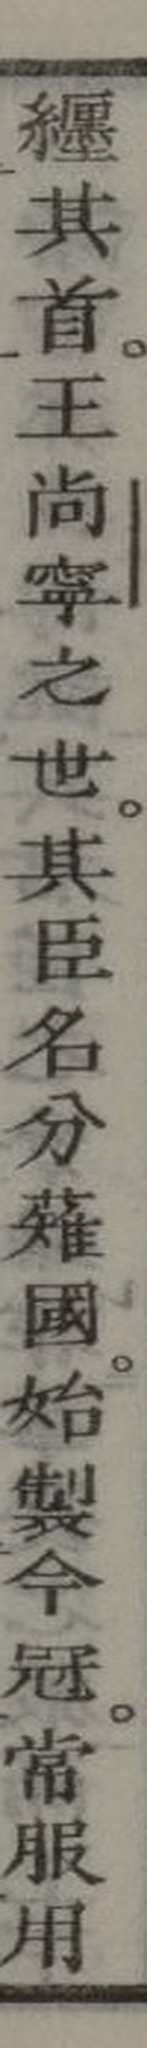纒其首。王尚寧之世。其臣名分薙國。始製今冠。常服用

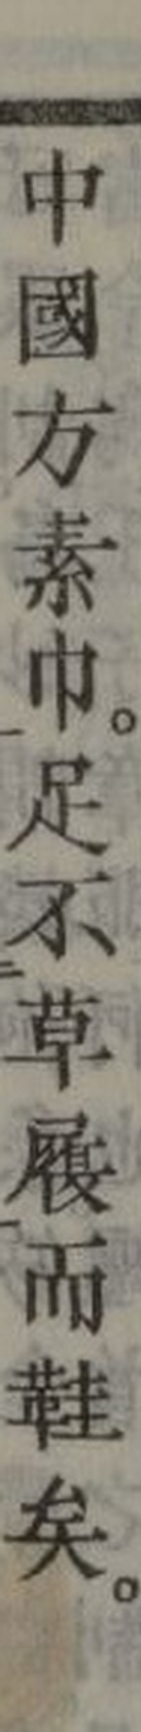中國方素巾。足不草履而鞋矣。
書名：南島志 呂
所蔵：University of the Ryukyus Library
